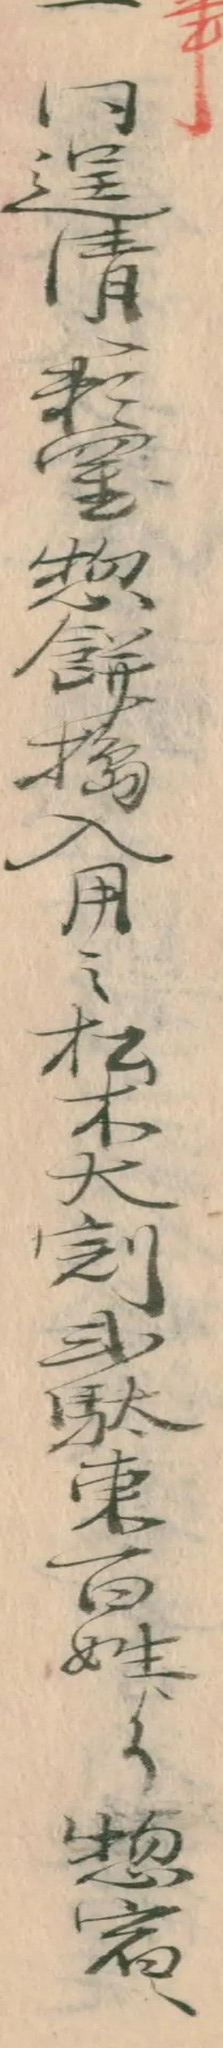一同逞清ニ頼置惣餅搗入用之松木大割弐駄東百姓より惣宿へ
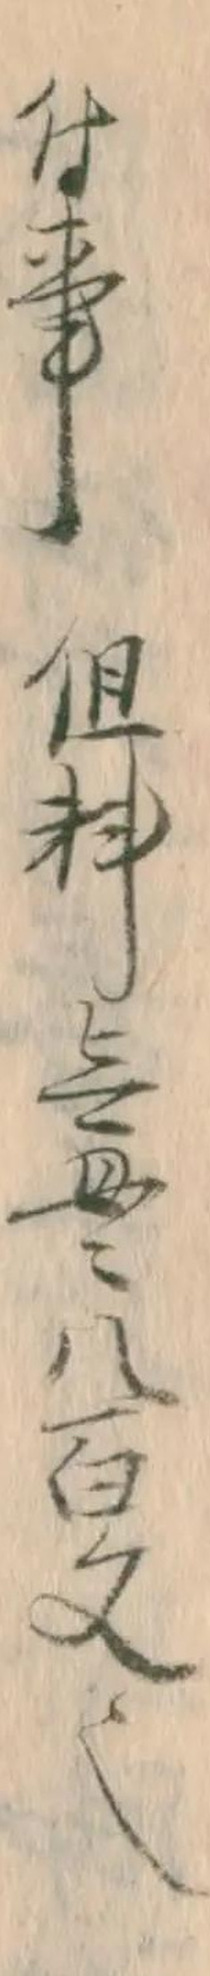付事但料壱貫八百文也
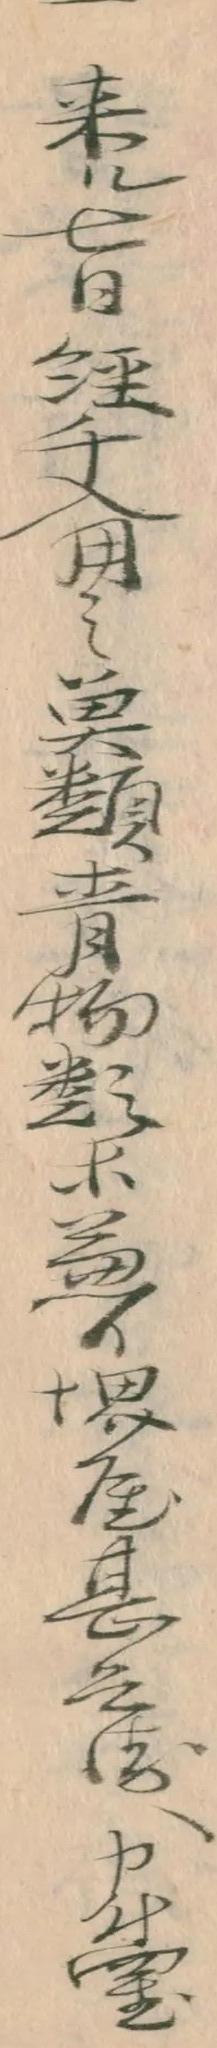一来ル七日経千入用之魚類青物類等兼而堺屋甚兵衛へ申付置
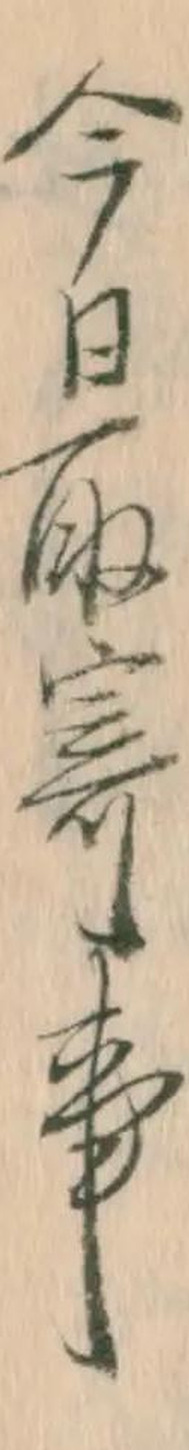今日取寄事
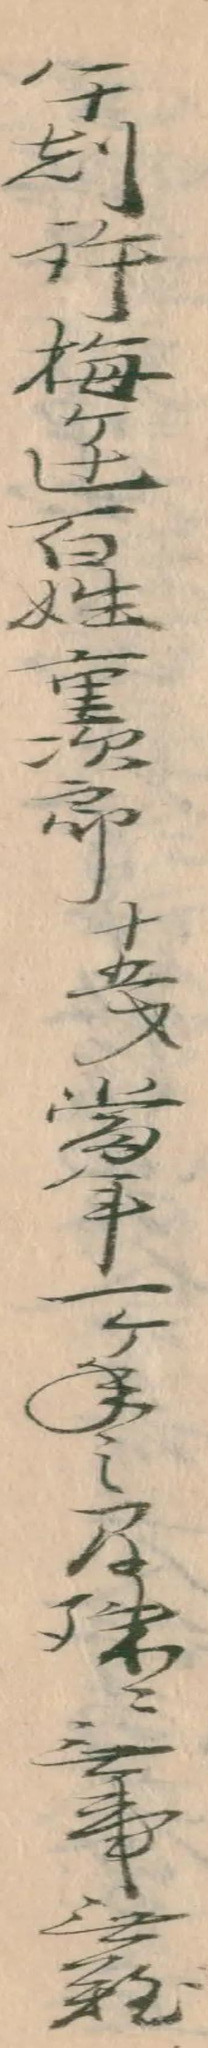一午刻許梅ケ辻百姓重次郎十五才當年一ケ年之間殊ニ無事無難
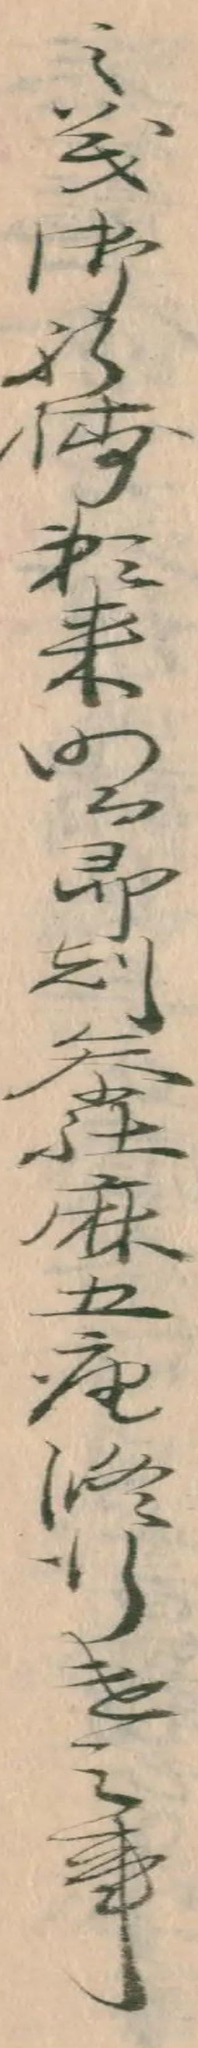之義御祈祷頼来仍而即刻久徳麻五座修行遣之事
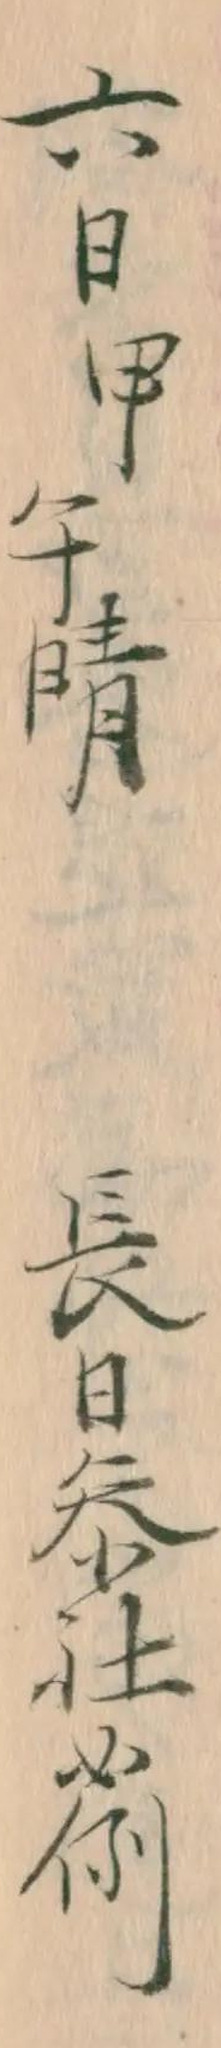六日甲午晴長日参社如例
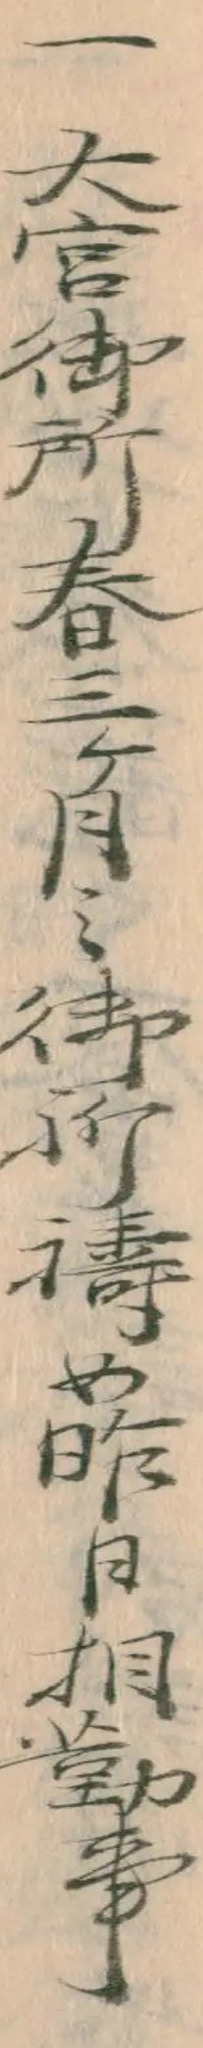一大宮御所春三ケ月之御祈祷如昨日相勤事
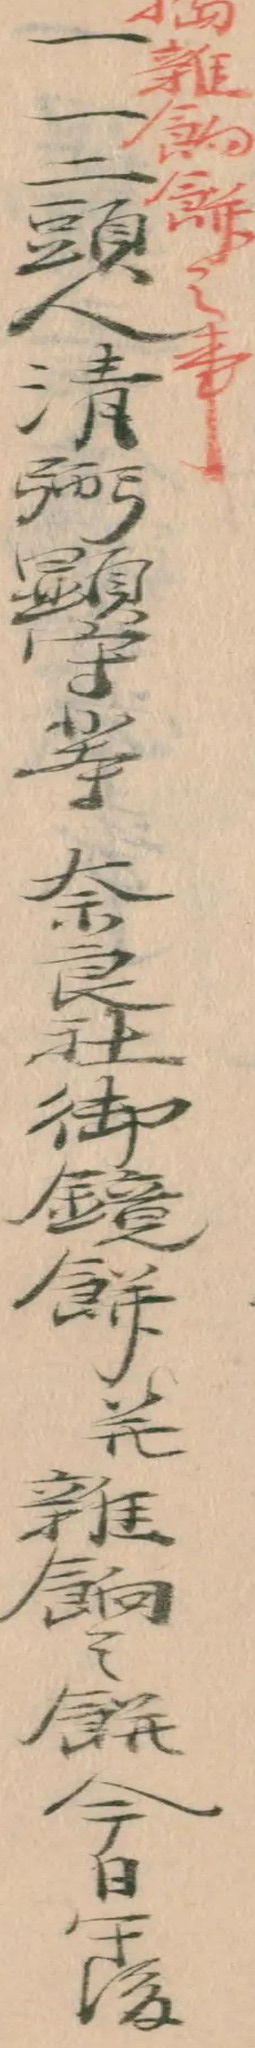一一二頭人清弼顕守等奈良社御鏡餅并雑餉之餅今日午後
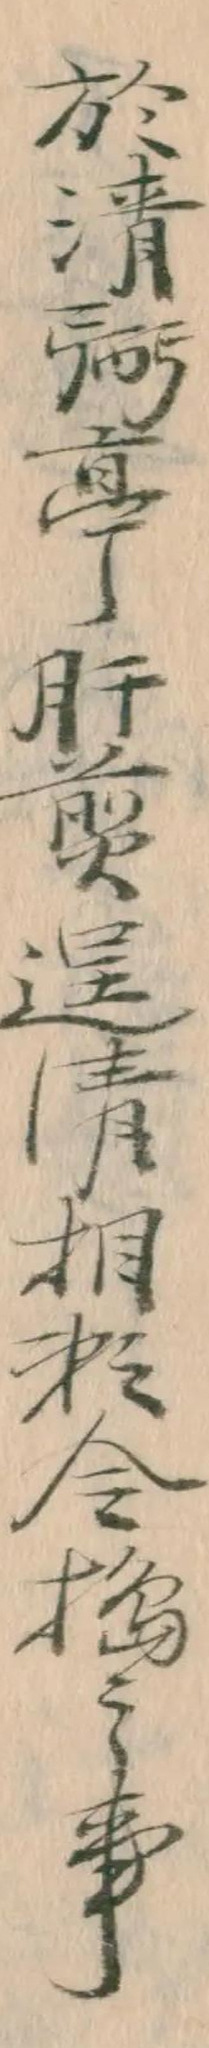於清弼亭肝煎逞清相頼令搗之事
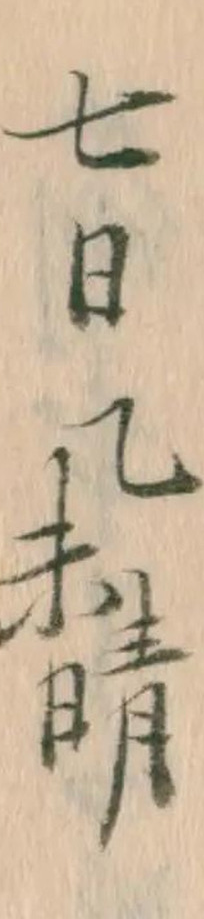七日乙未晴
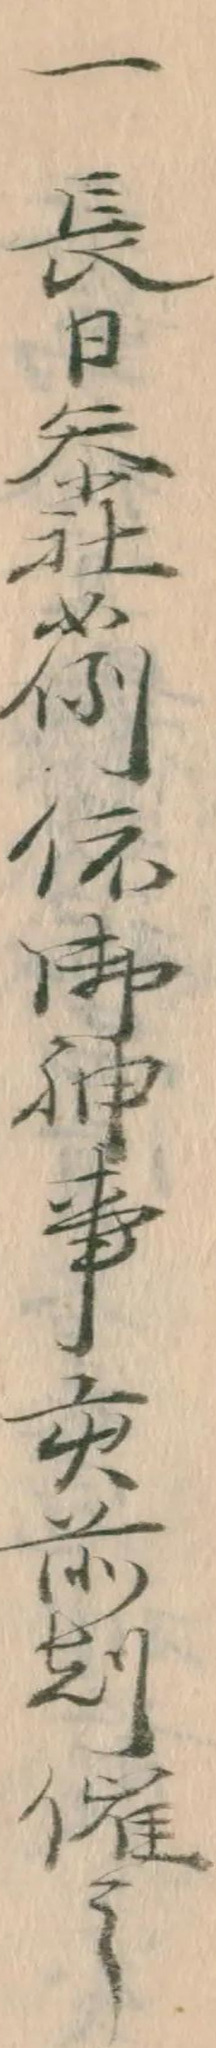一長日参社如例依御神事亥前刻催之
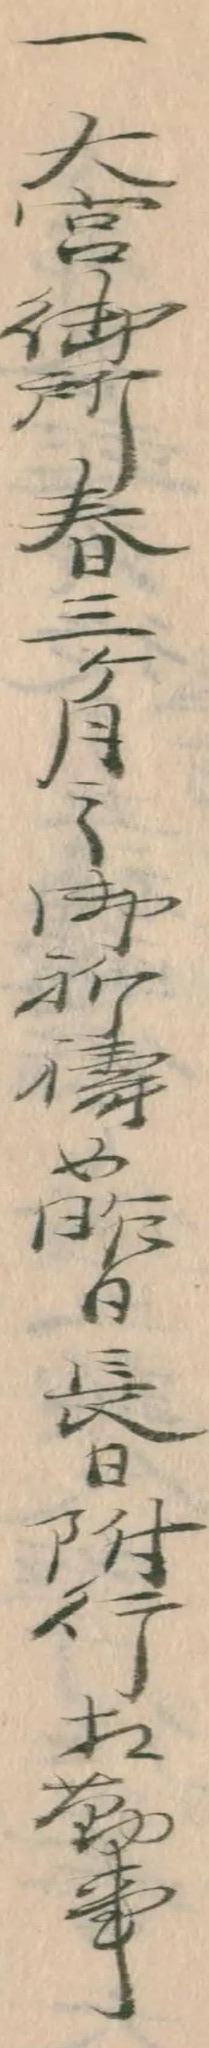一大宮御所春三ケ月之御祈祷如昨日長日附行相勤事
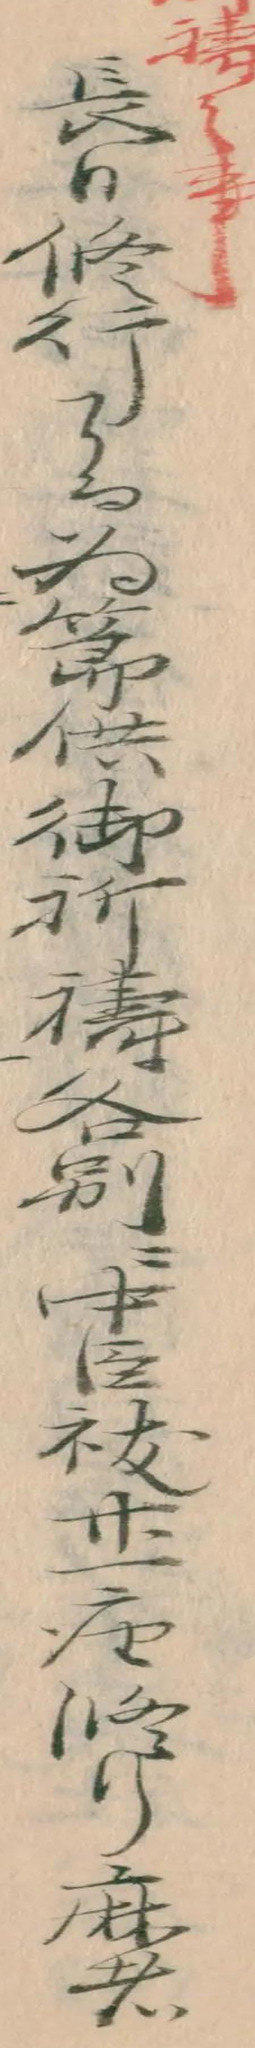一長日修行了而為節供御祈祷各別ニ中臣祓廿一座修行麻者
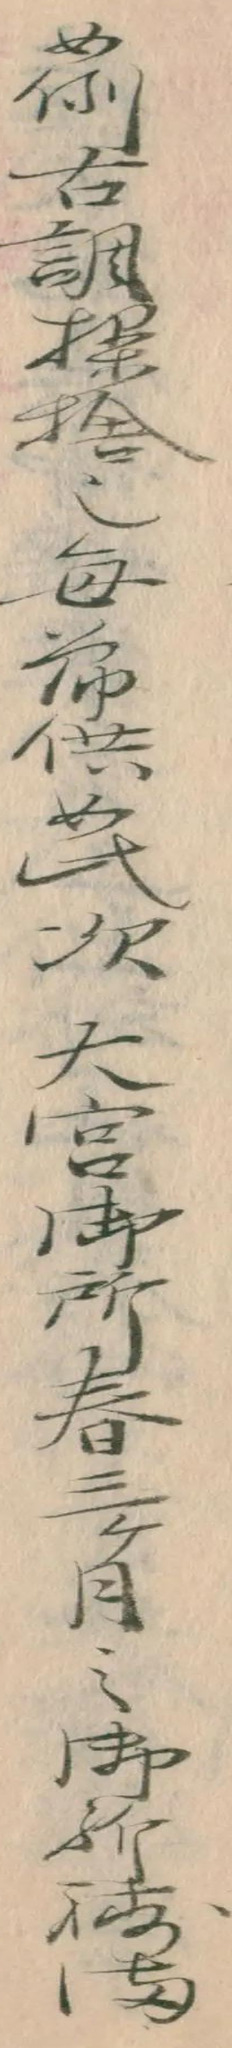如例古調繰捨也毎節供如此次大宮御所春三ケ月之御祈祷満
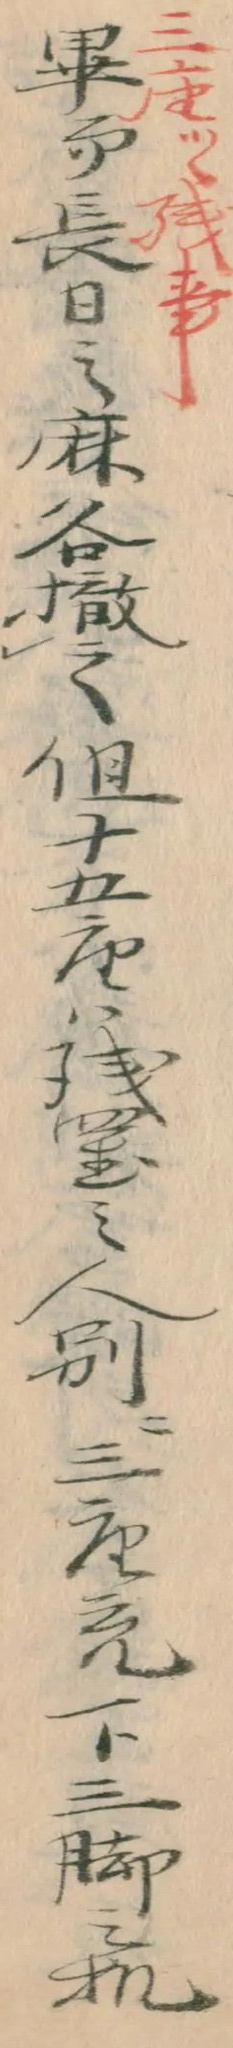畢而長日之麻各撒之但十五座ハ残之人別ニ三座宛下三脚之机
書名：賀茂社記録. 第74冊
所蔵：国立国会図書館 National Diet Library, JAPAN
